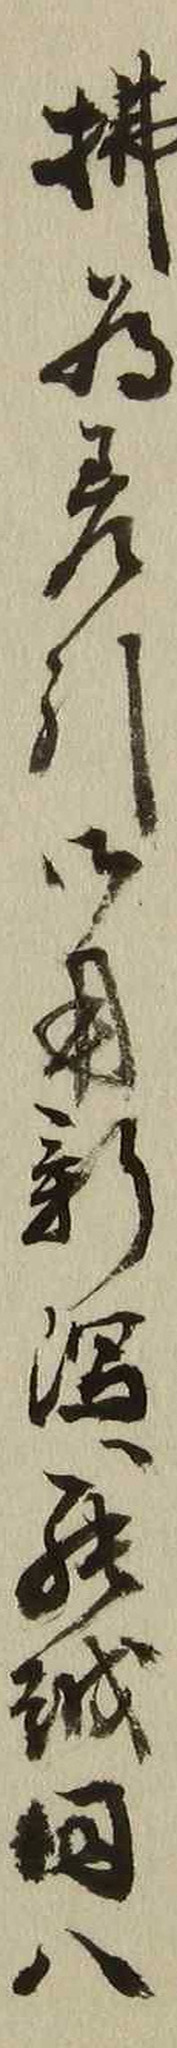払為差引御用新潟へ罷越同八
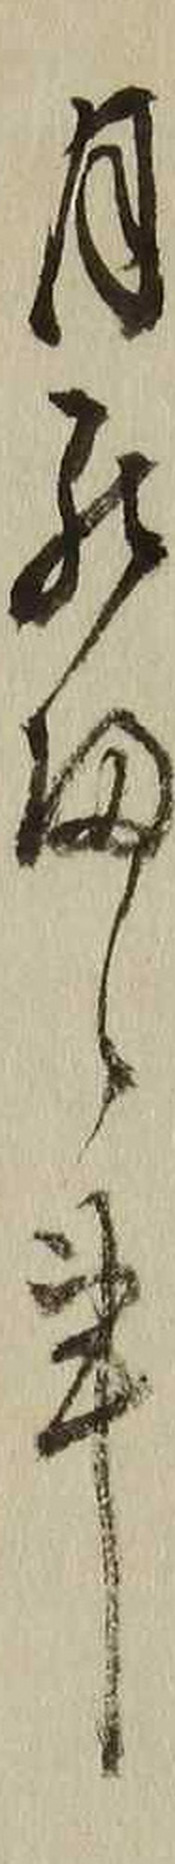月罷帰候事
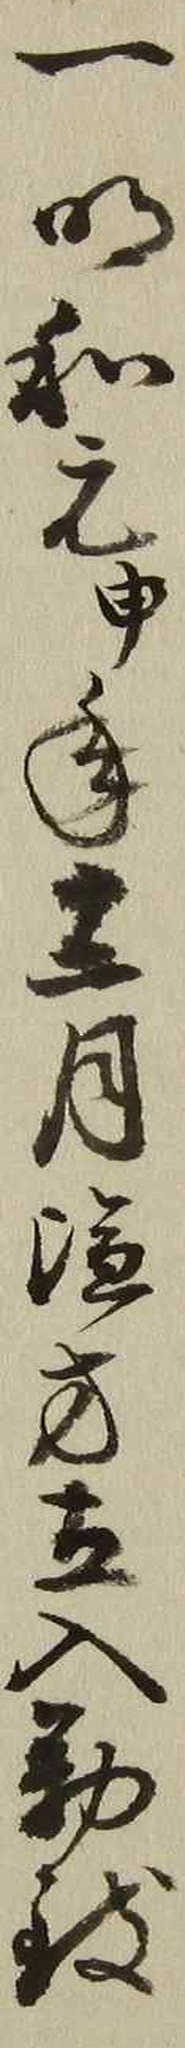一明和元申年十二月塩方立入勤致
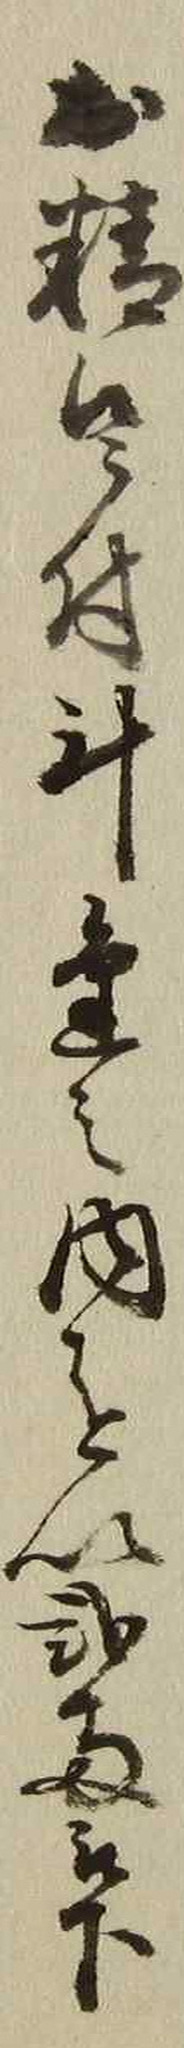出精候に付計金之内を以弐両被下
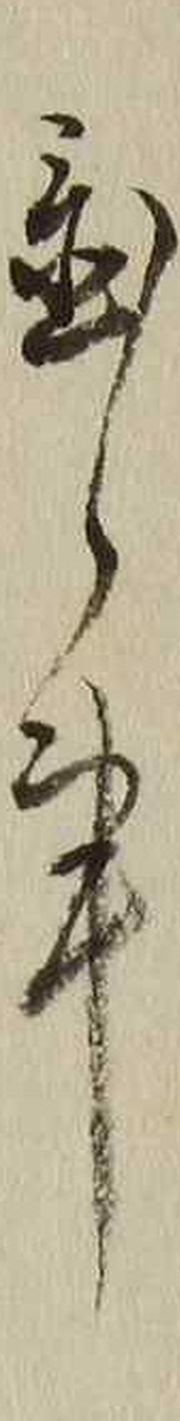置候事
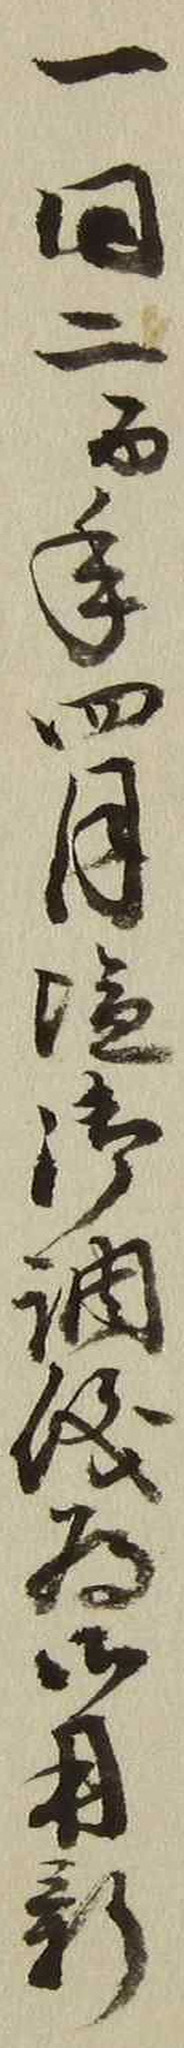一同二酉年四月塩御調儀為御用新
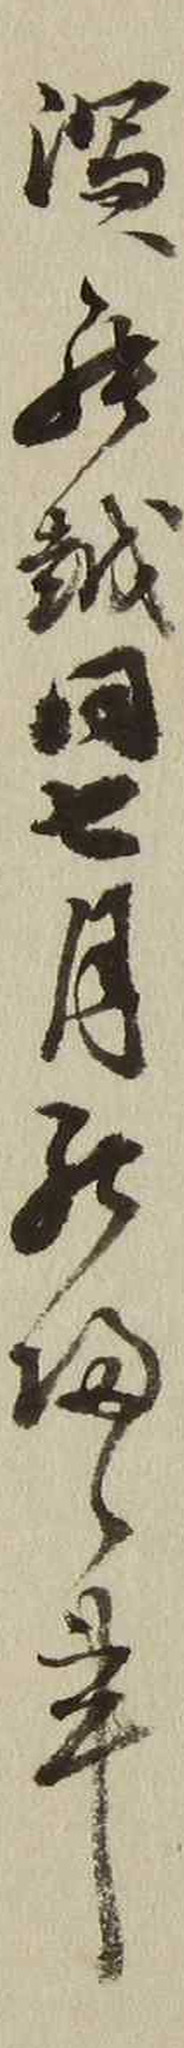潟へ罷越同七月罷帰候事
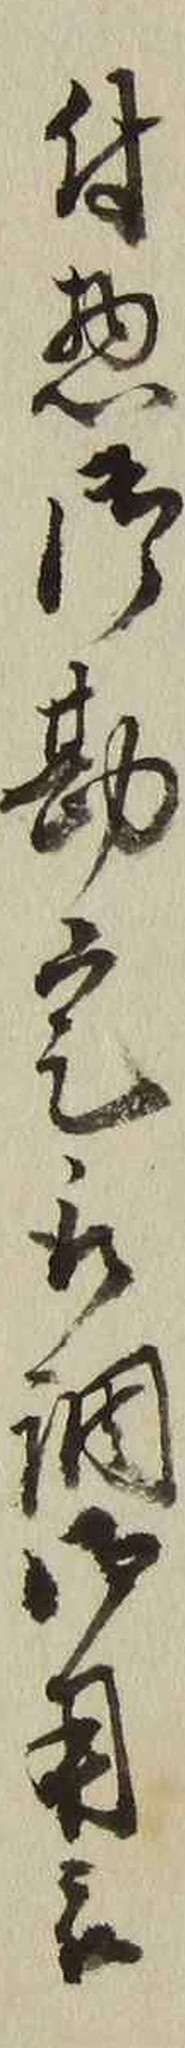付惣御勘定被調御用被
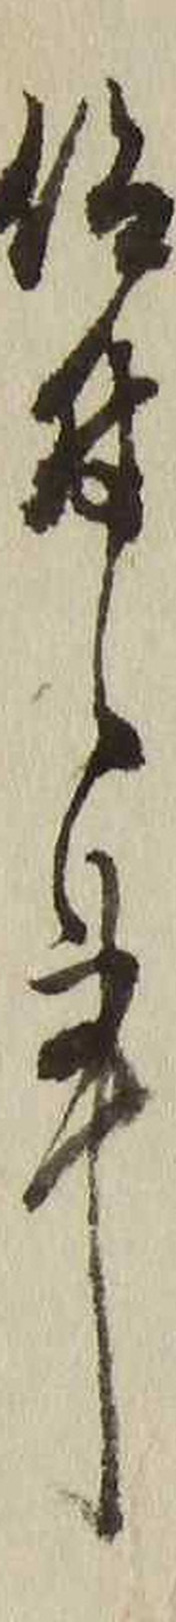仰付候事

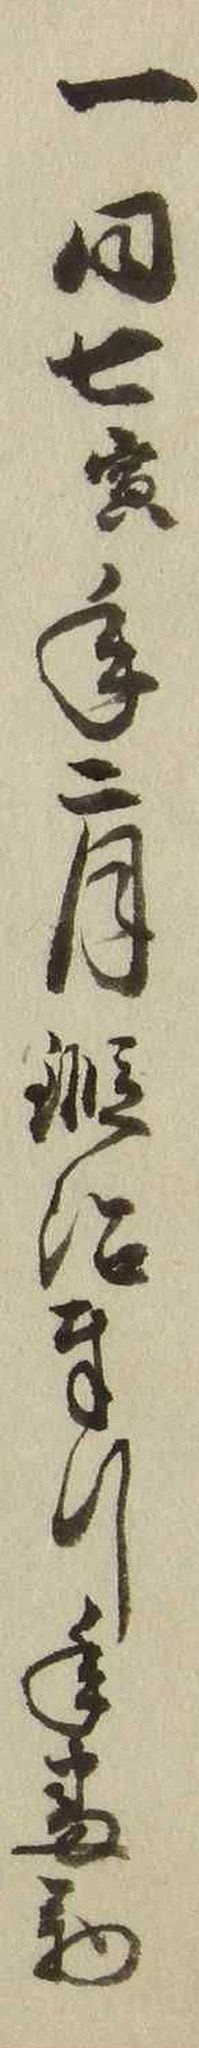一同七寅年二月鍛冶奉行年番勤
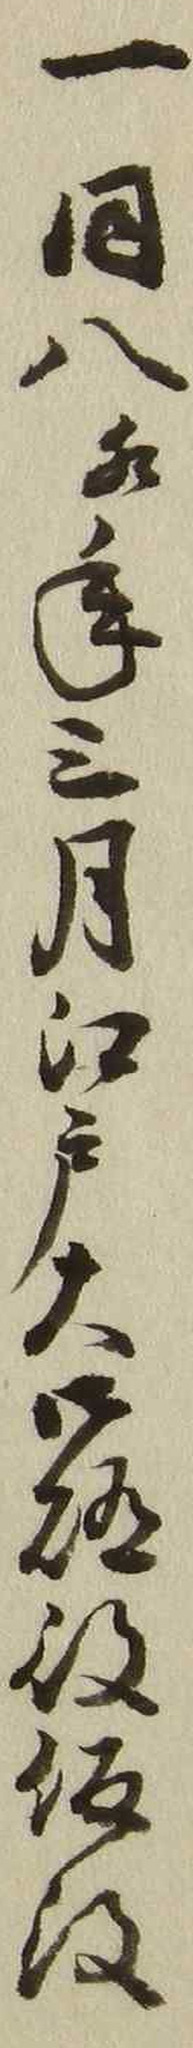一同八卯年三月江戸大口賄役仮役
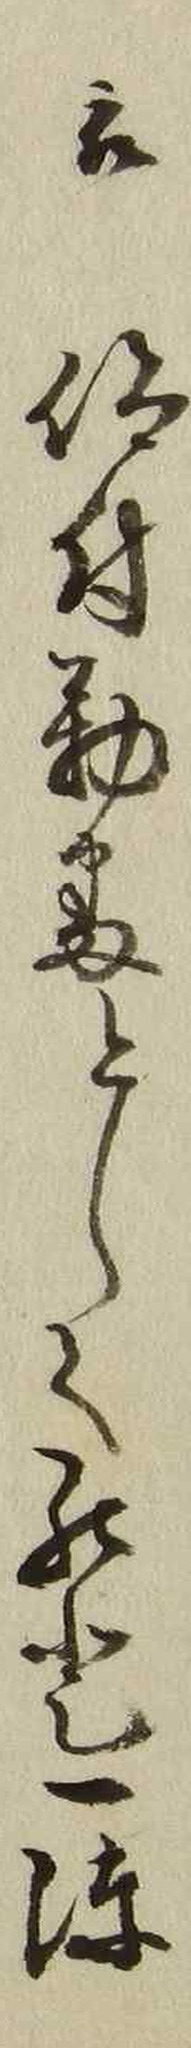被仰付勤番として罷登一陣
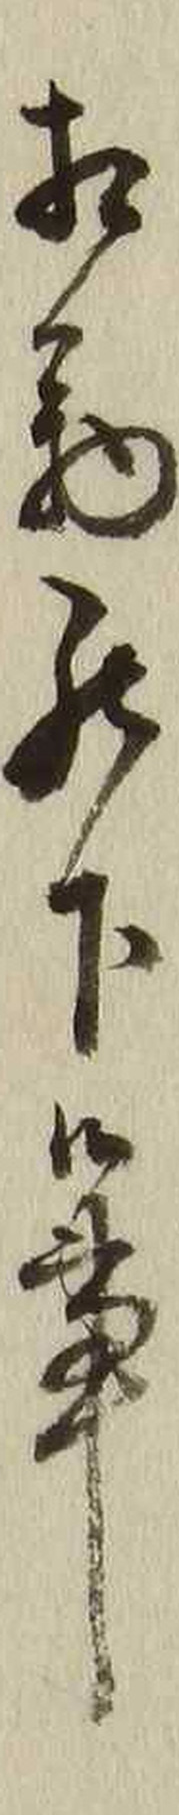相勤罷下候事
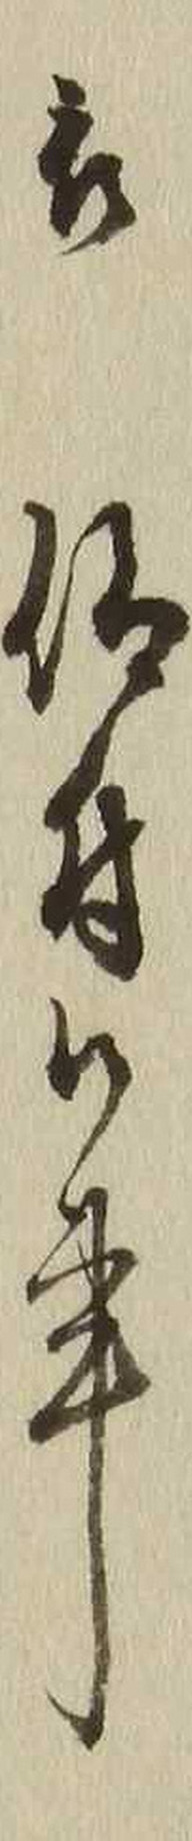被仰付候事
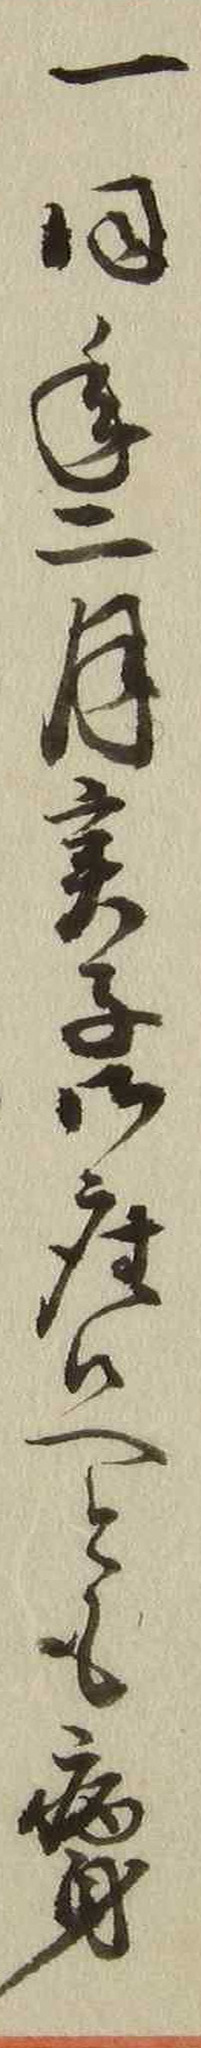一同年二月実子御座候へとも病身
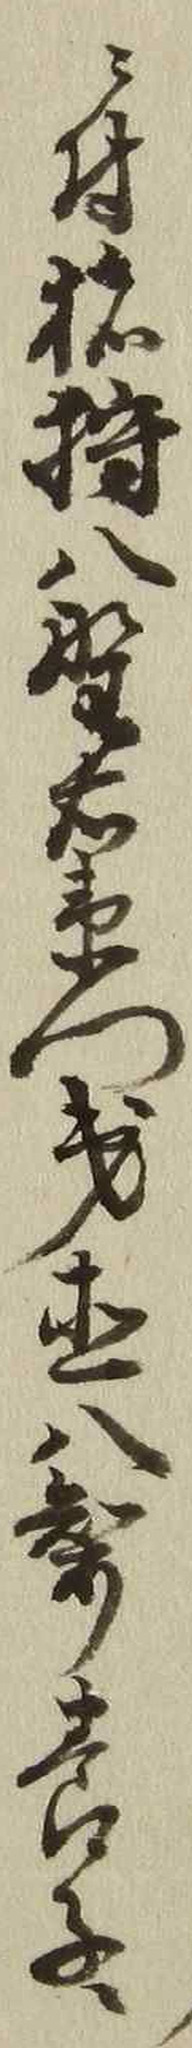に付猪狩八野右衛門弟直八聟養子に
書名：諸士系譜　巻之38　は之部6
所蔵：会津若松市立会津図書館
